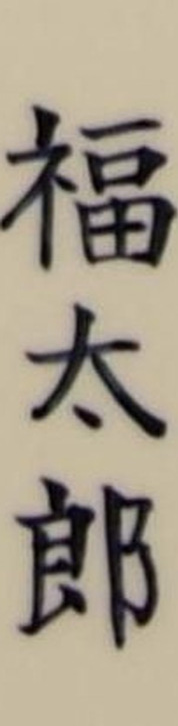福太郎
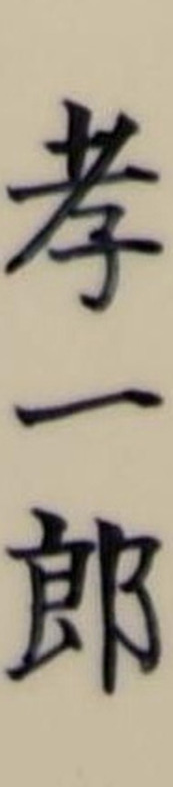孝一郎
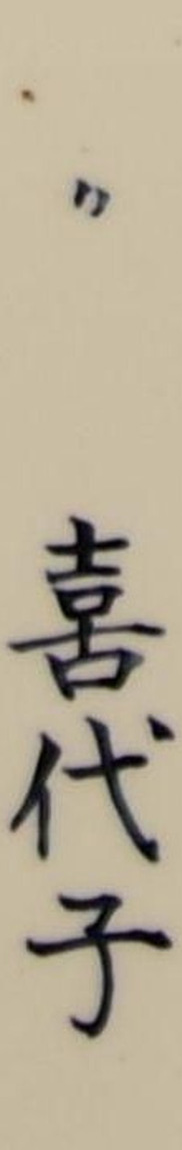喜代子
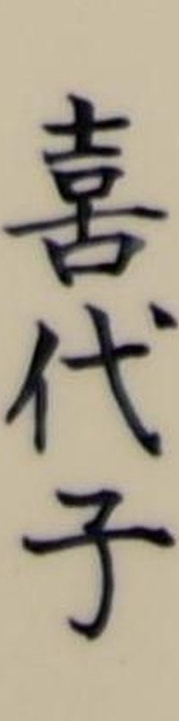喜代子
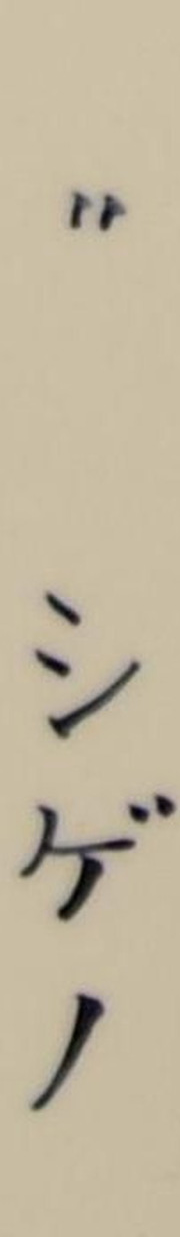シゲノ
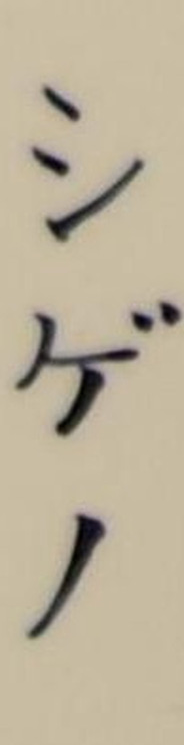シゲノ
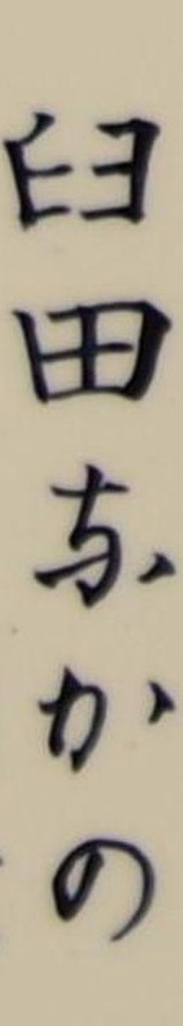臼田なかの
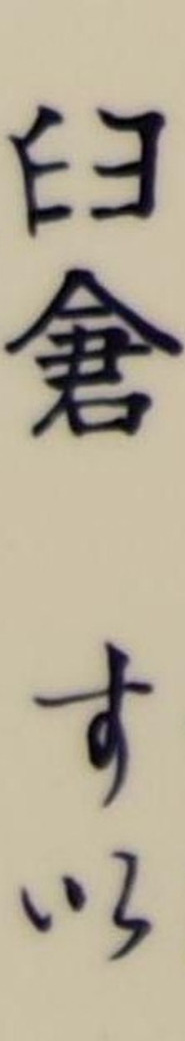臼倉すい
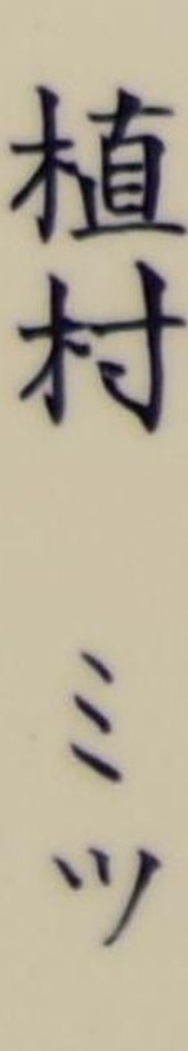植村ミツ
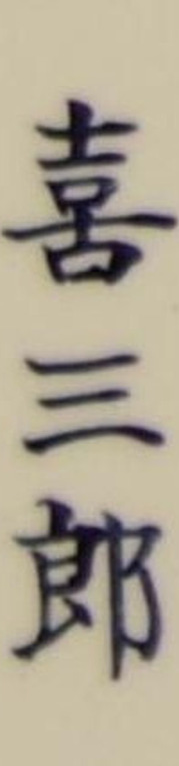喜三郎

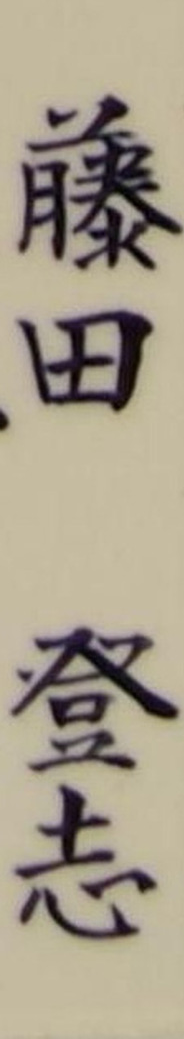藤田登志
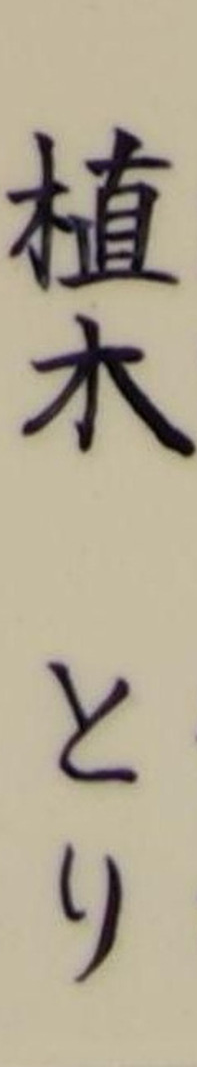植木とり
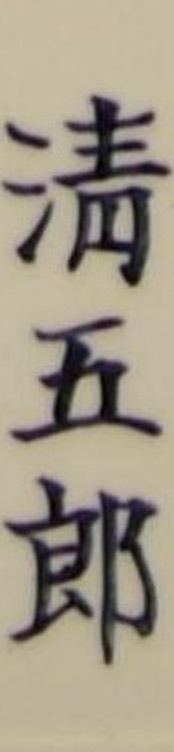清五郎
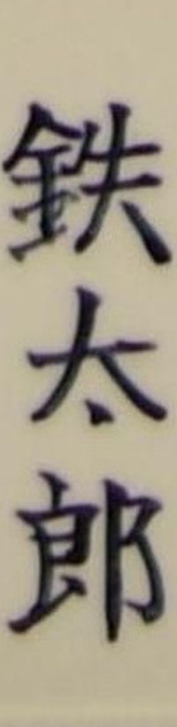鉄太郎
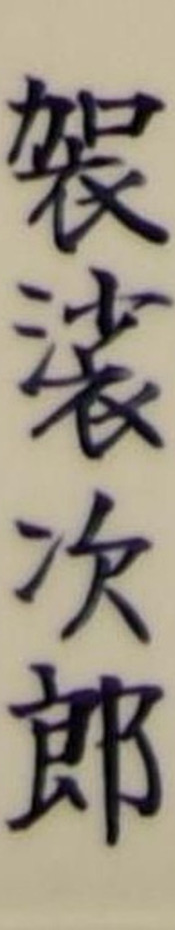袈裟次郎
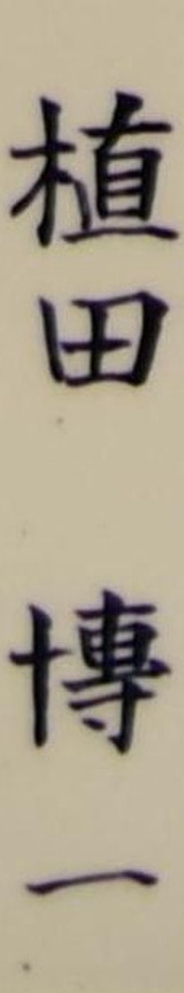植田博一
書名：A~D
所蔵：koyasan kongobuji
